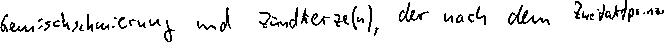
Gemischschmierung und Zündkerze(n), der nach dem Zweitaktprinzip
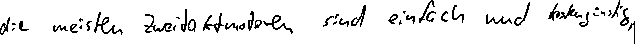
die meisten Zweitaktmotoren sind einfach und kostengünstig,
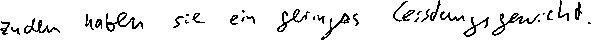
zudem haben sie ein geringes Leistungsgewicht.
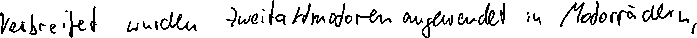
Verbreitet wurden Zweitaktottomotoren angewendet in Motorrädern,
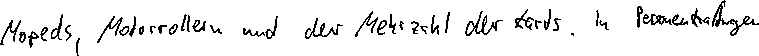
Mopeds, Motorrollern und der Mehrzahl der Karts. In Personenkraftwagen
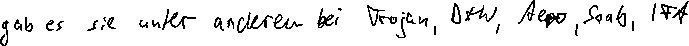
gab es sie unter anderem bei Trojan, DKW, Aero, Saab, IFA
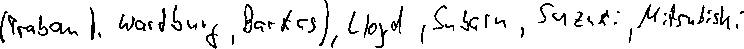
(Trabant, Wartburg, Barkas), Lloyd, Subaru, Suzuki, Mitsubishi
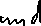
und
